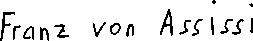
Franz von Assisi
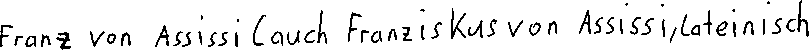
Franz von Assisi (auch Franziskus von Assisi, lateinisch
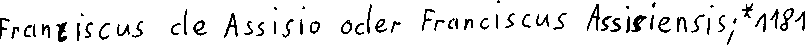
Franciscus de Assisio oder Franciscus Assisiensis; * 1181
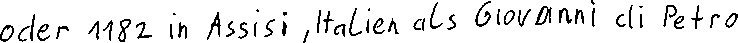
oder 1182 in Assisi, Italien als Giovanni di Pietro
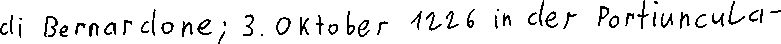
di Bernardone; 3. Oktober 1226 in der Portiuncula-
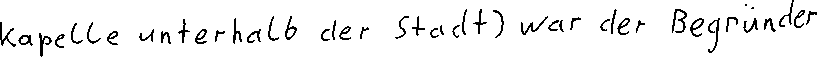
Kapelle unterhalb der Stadt) war der Begründer
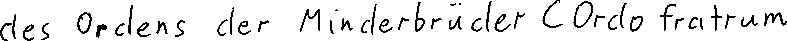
des Ordens der Minderbrüder (Ordo fratrum
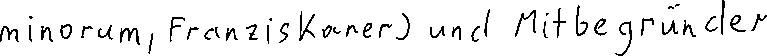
minorum, Franziskaner) und Mitbegründer
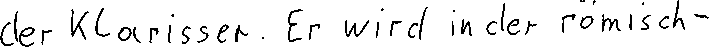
der Klarissen. Er wird in der römisch-
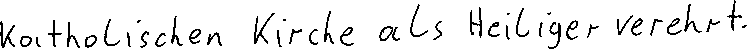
katholischen Kirche als Heiliger verehrt.
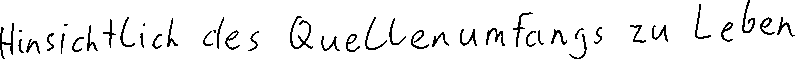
Hinsichtlich des Quellenumfangs zu Leben
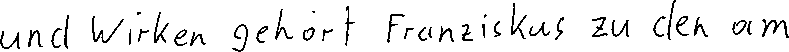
und Wirken gehört Franziskus zu den am
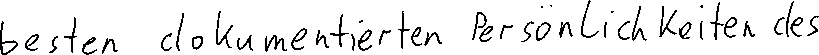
besten dokumentierten Persönlichkeiten des
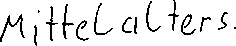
Mittelalters.
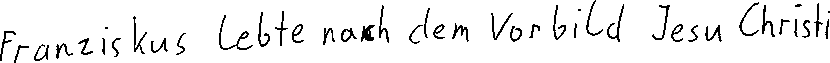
Franziskus lebte nach dem Vorbild Jesu Christi
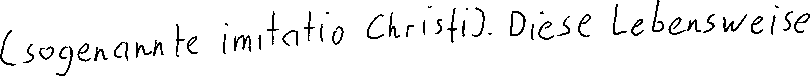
(sogenannte imitatio Christi). Diese Lebensweise
